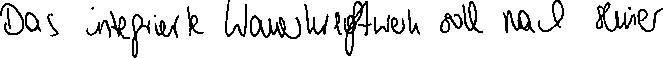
Das integrierte Wasserkraftwerk soll nach seiner
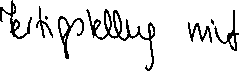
Fertigstellung mit
